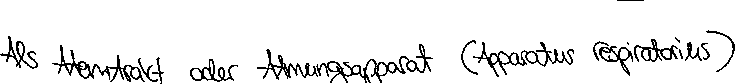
Als Atemtrakt oder Atmungsapparat (Apparatus respiratorius)
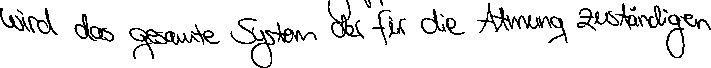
wird das gesamte System der für die Atmung zuständigen
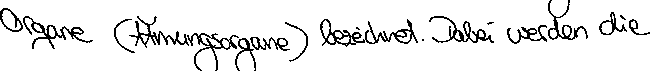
Organe (Atmungsorgane) bezeichnet. Dabei werden die
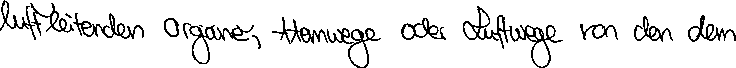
luftleitenden Organe, Atemwege oder Luftwege von den dem
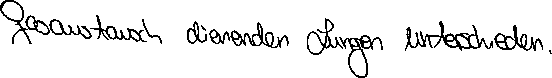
Gasaustausch dienenden Lungen unterschieden.
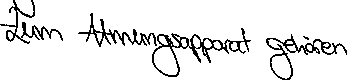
Zum Atmungsapparat gehören
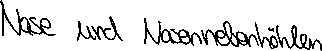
Nase und Nasennebenhöhlen
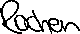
Rachen
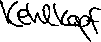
Kehlkopf
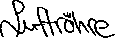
Luftröhre
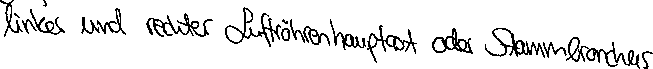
linker und rechter Luftröhrenhauptast oder Stammbronchus
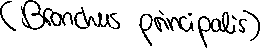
(Bronchus principalis)
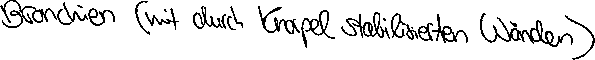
Bronchien (mit durch Knorpel stabilisierten Wänden)
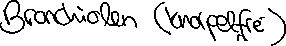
Bronchiolen (knorpelfrei)
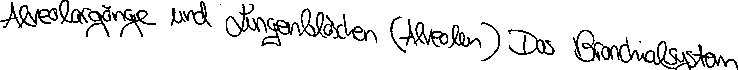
Alveolargänge und Lungenbläschen (Alveolen)Das Bronchialsystem
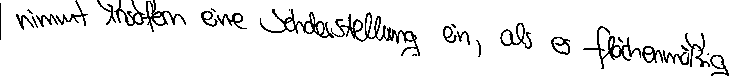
nimmt insofern eine Sonderstellung ein, als es flächenmäßig
